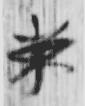東
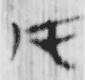厇
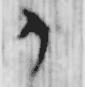人
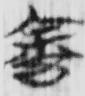舒
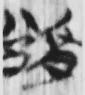豫
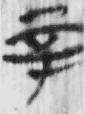辛
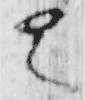巳
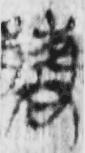酅
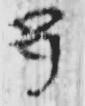邑
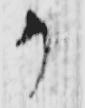人
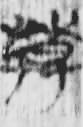登
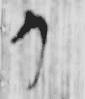人
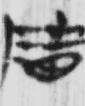晨
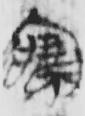寢
